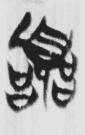囂
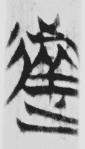{辶止㚔}
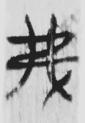弗
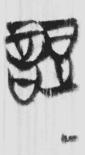{言豆}
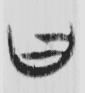曰
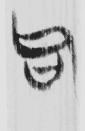句
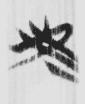我
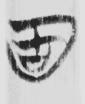固
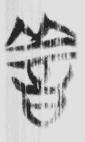善
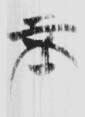不
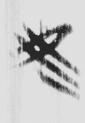我
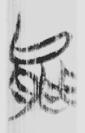能
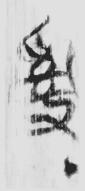𤔔
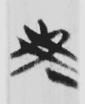我
